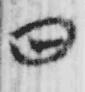日
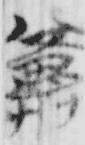畢
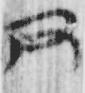尹
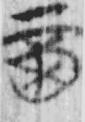梄
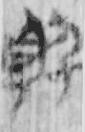與
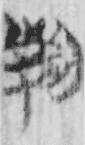○（濮）
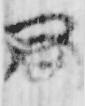君
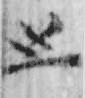之
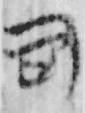司
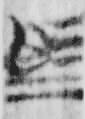馬
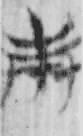奉
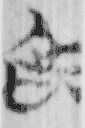爲
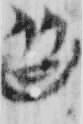皆
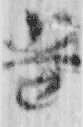告
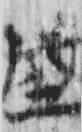城（成）
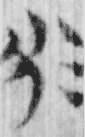小人
